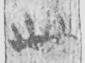卌
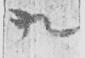九
